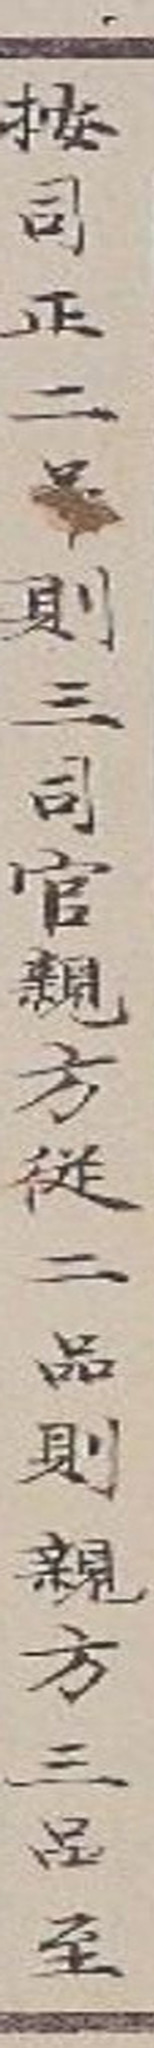按司正二則三司官親方従二品則親方三品至
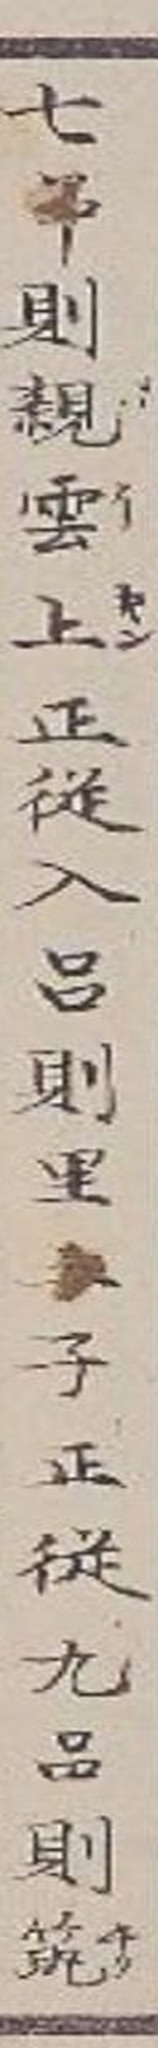七則親雲上正従入呂則里子正従九品則筑
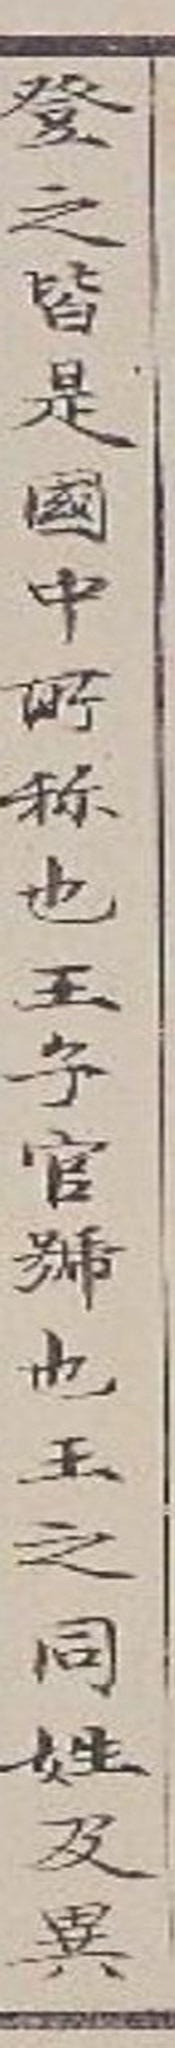登之皆是国中所称也王子官号也王之同姓及異
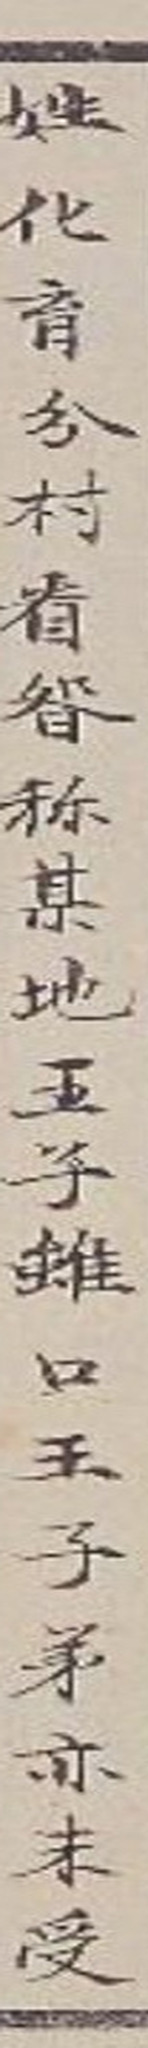姓化育分村看昝称某地王子雖口王子弟亦未受
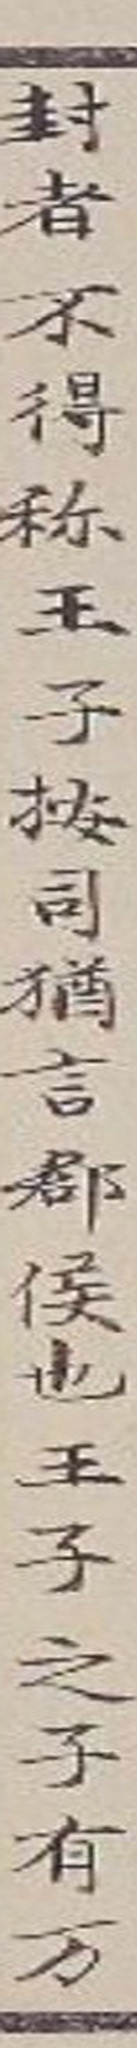封者不得称王子按司猶言郡侯也王子之子有万
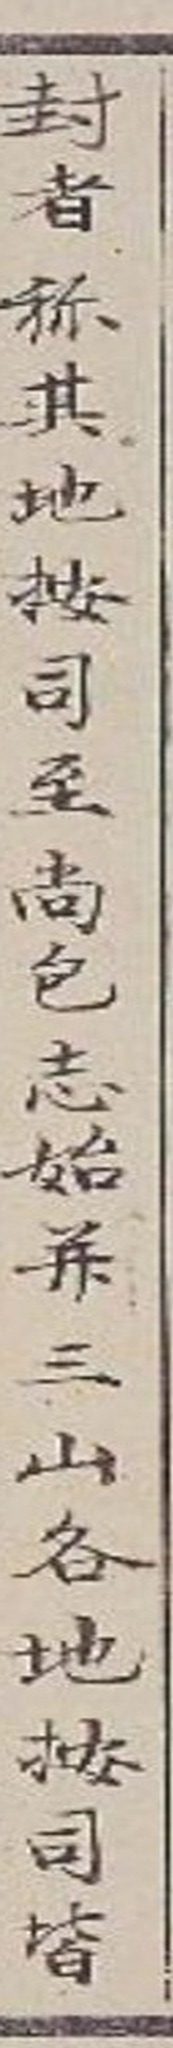封者称其地按司至尚包志始并三山各地按司皆
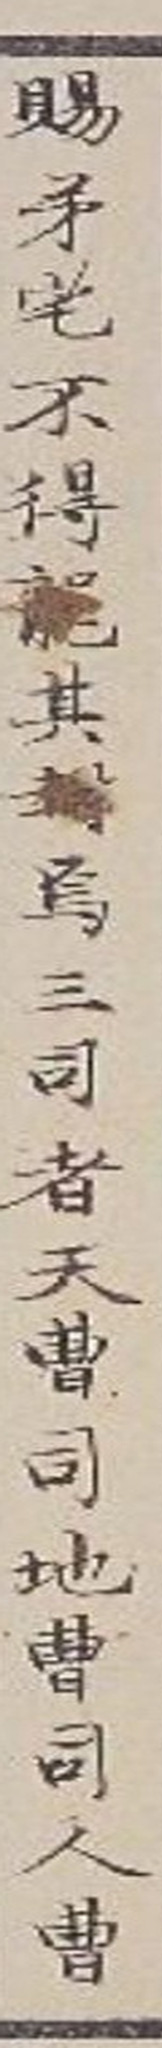賜弟宅不得其焉三司者天曹司地曹司人曹
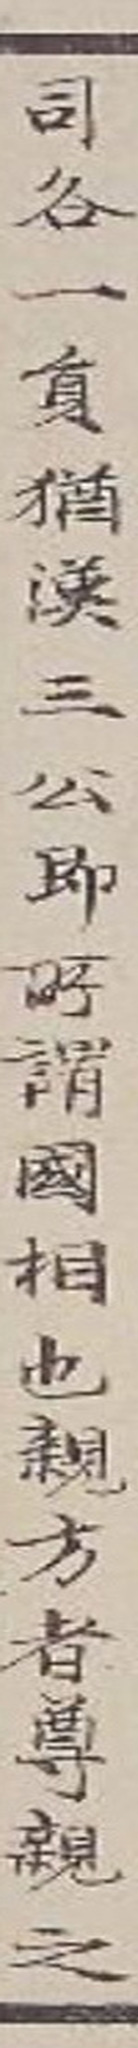司各一員猶漢三公即所謂国相也親方者尊親之
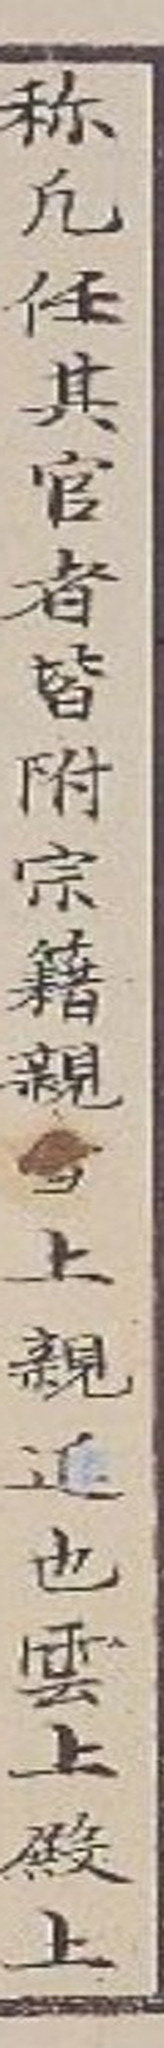称凡任其官者皆附宗籍親上親近也雲上殿上
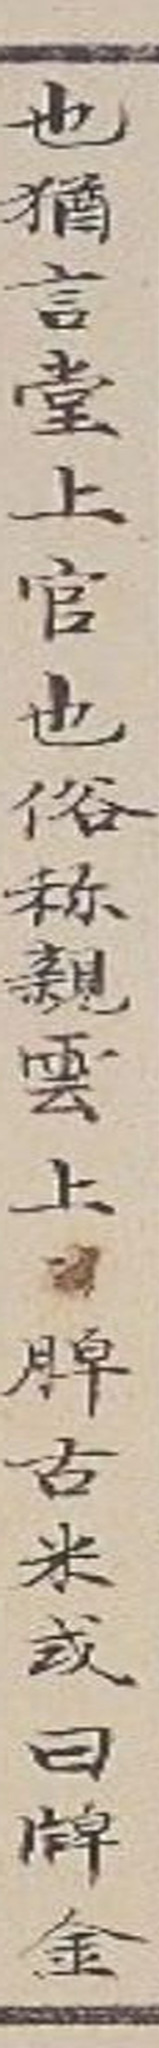也猶言堂上官也俗称親雲上古米或曰牌金
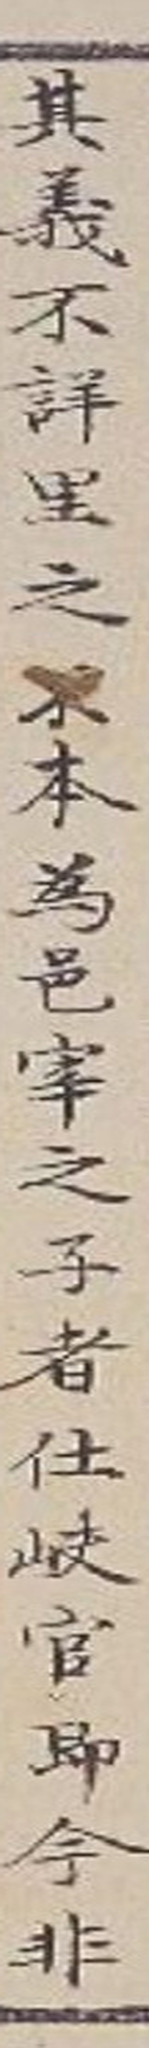其義不詳里之本為邑宰之子者仕官即今非
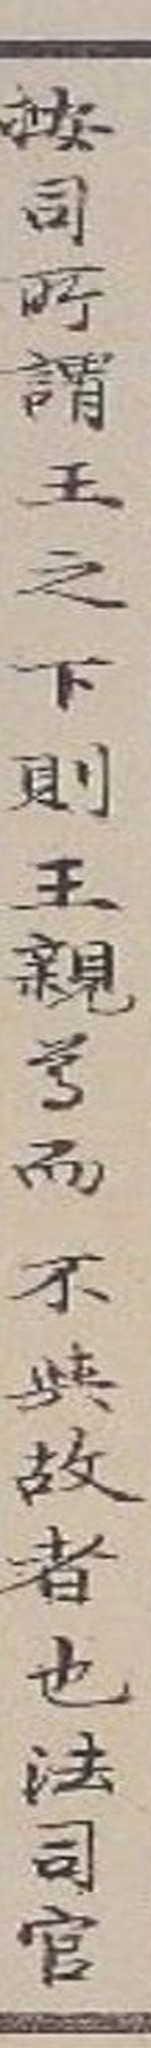按司所謂王之下則王親尊而不与故者也法司官

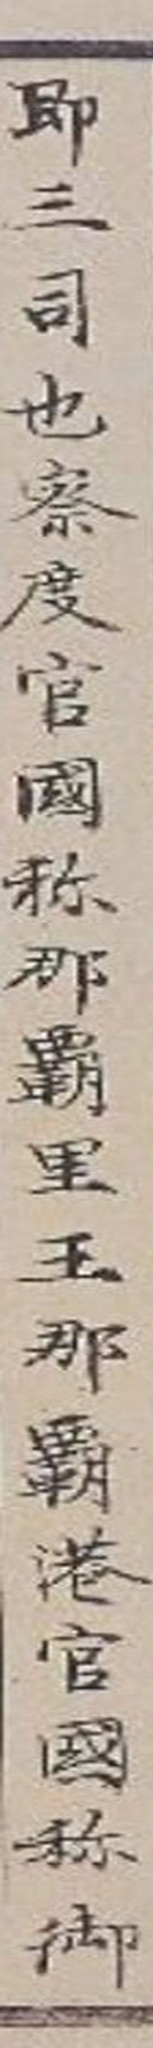即三司也察度官国称那覇里王那覇港官国称御
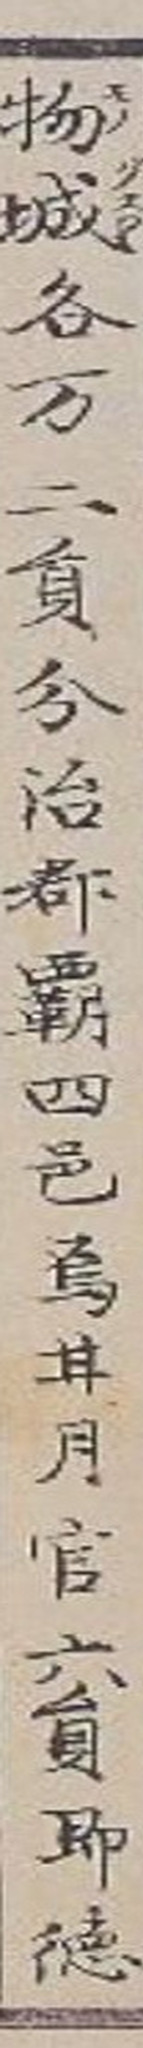物城各万二員分治那覇四邑焉月官六員即徳
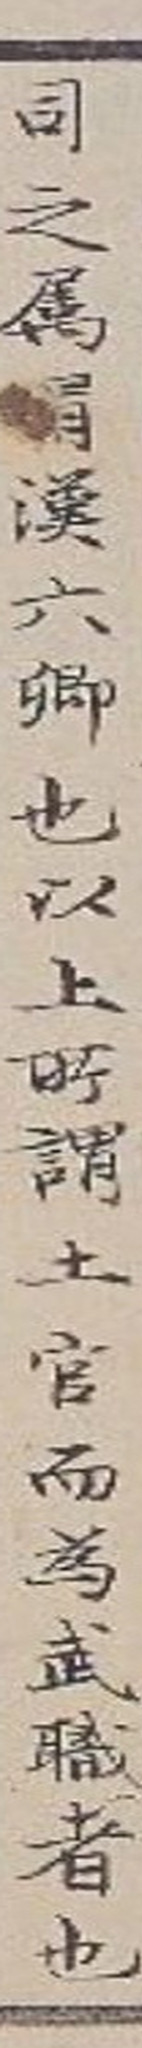司之属漢六卿也以上所謂土官而為武職者也
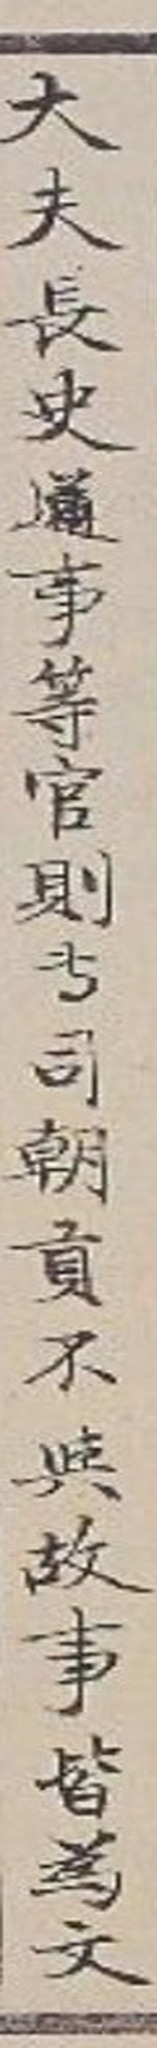大夫長史通事等官則専司朝貢不与故事皆為文
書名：南島志 全
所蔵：University of the Ryukyus Library
